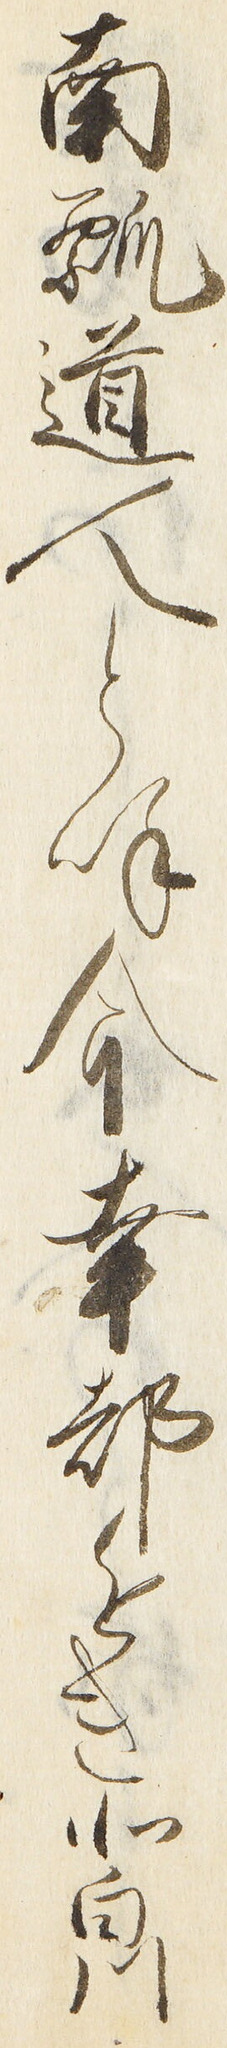南瓢道人と呼今幸都近き北白川
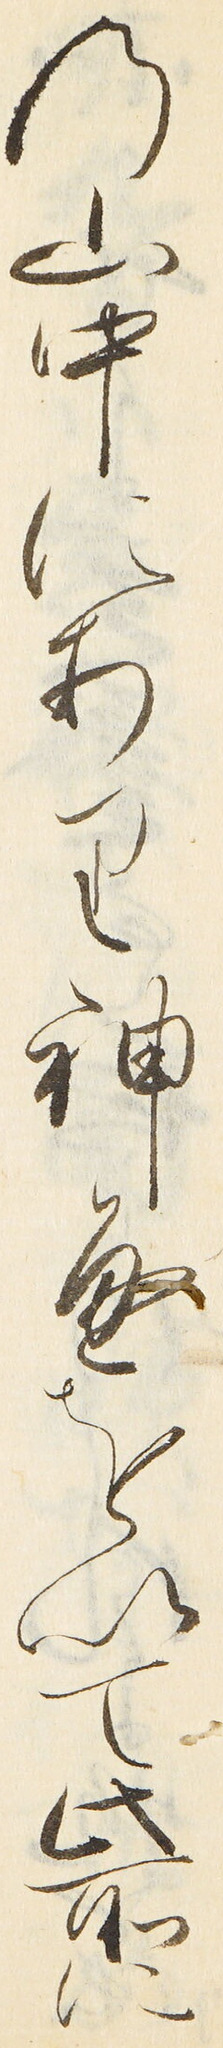の山中にあり神通を以て此所に
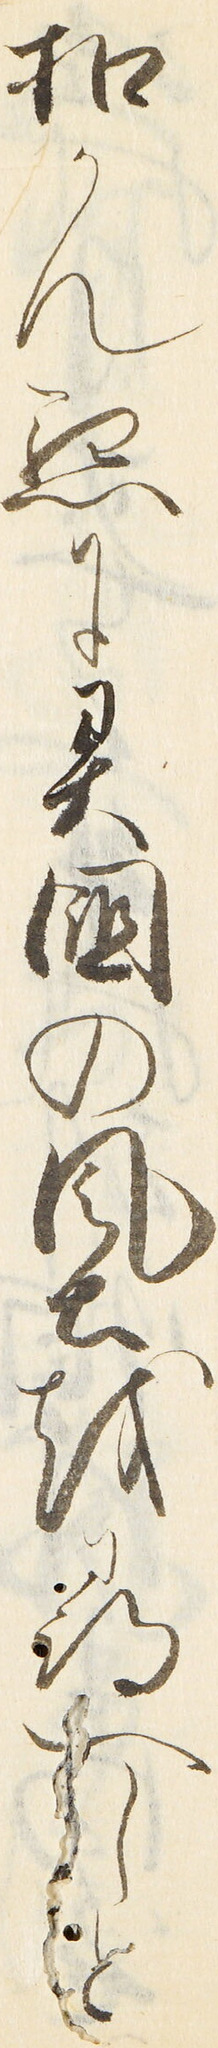招かん懇に異国の風土を尋へしと
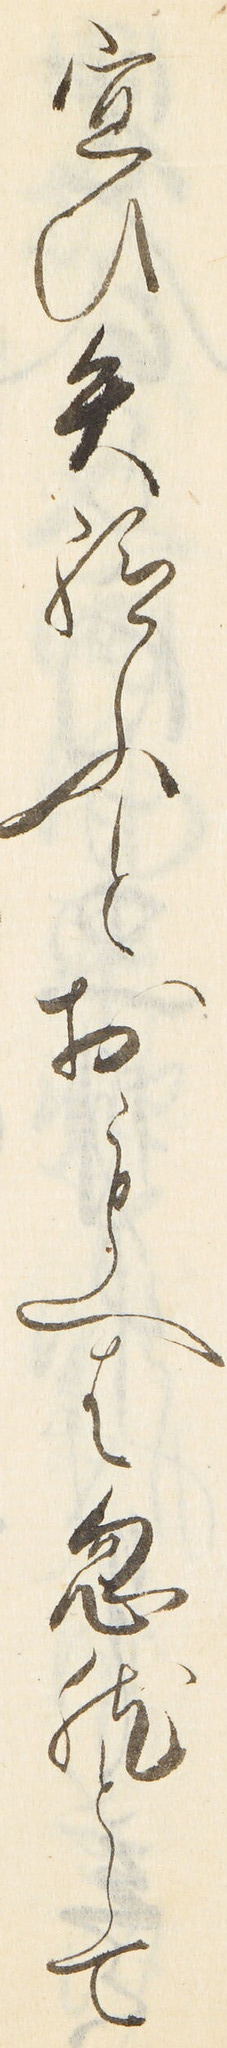宣ひ失給ふとおもヘは忽然として
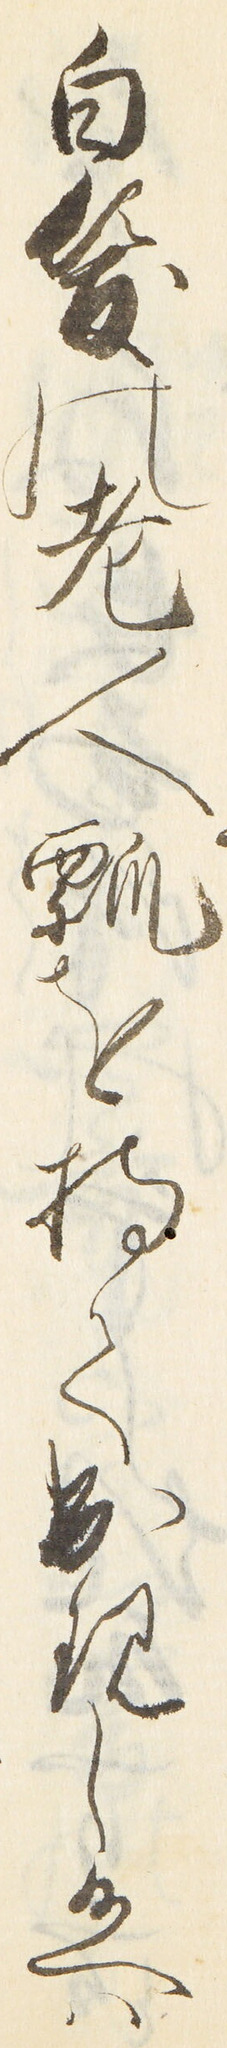白髪の老人瓢を持て出現し給へは
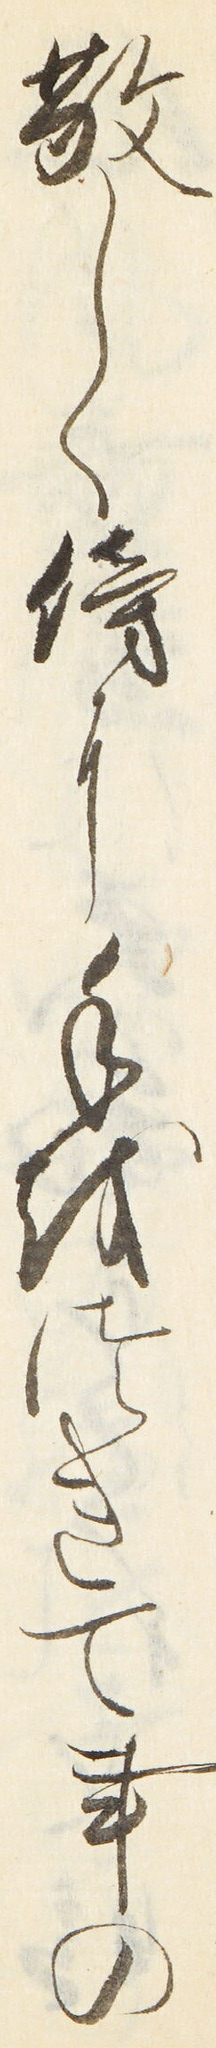敬しく傍に手をつきて事の
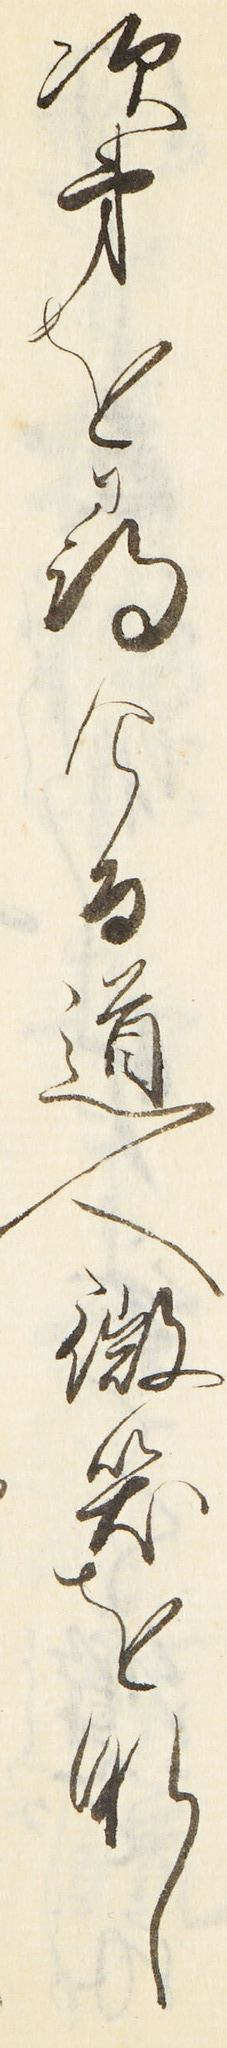次第を尋ける道人微笑をなし
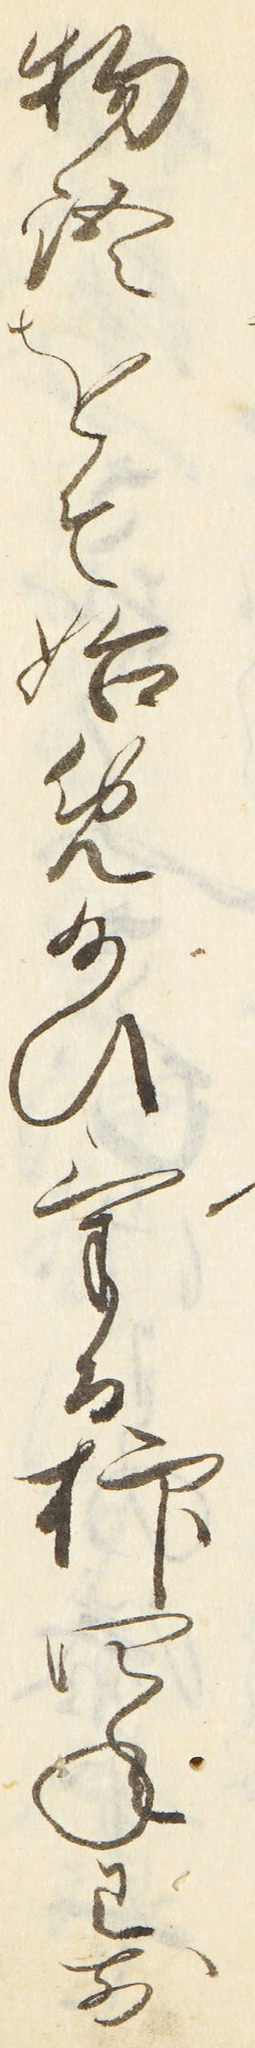物語をそ始め給ひける抑四年已前
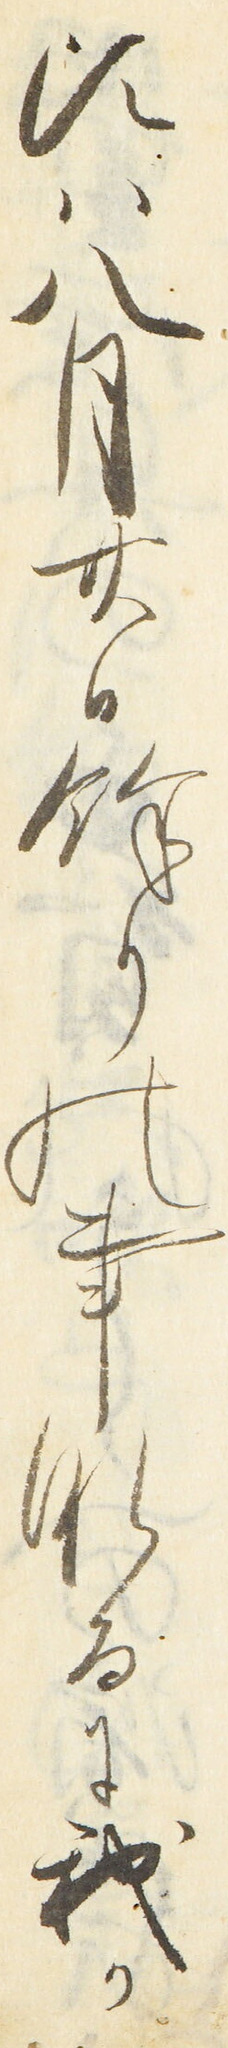頃は八月廿日余りの事なるに我か
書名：南瓢記
